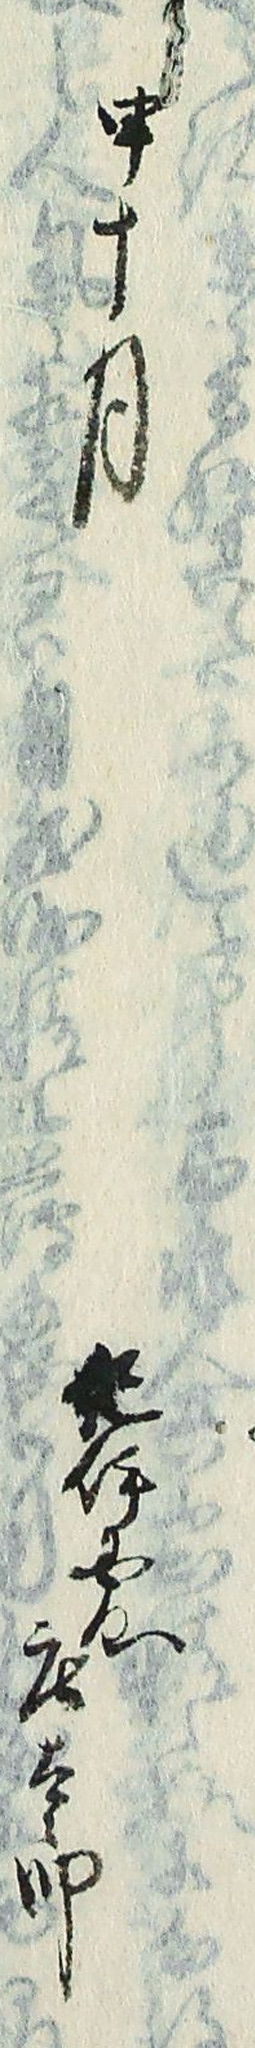申十月紀伊国屋
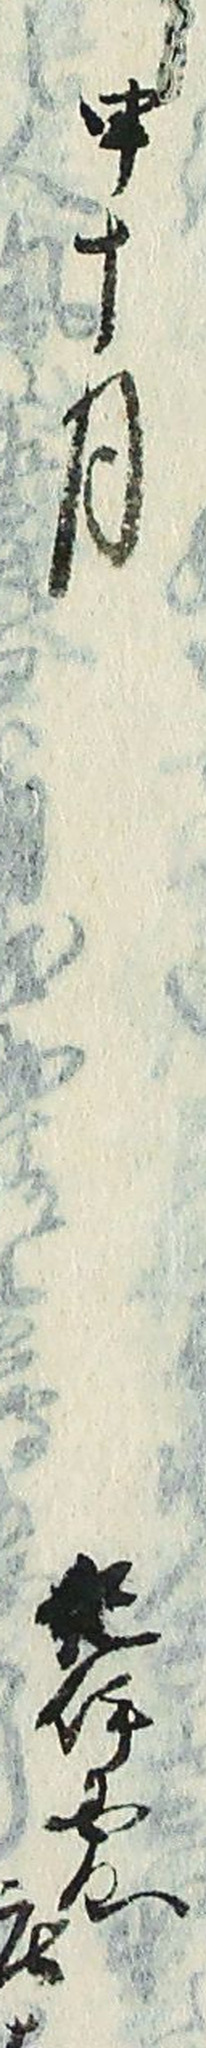申十月紀伊国屋
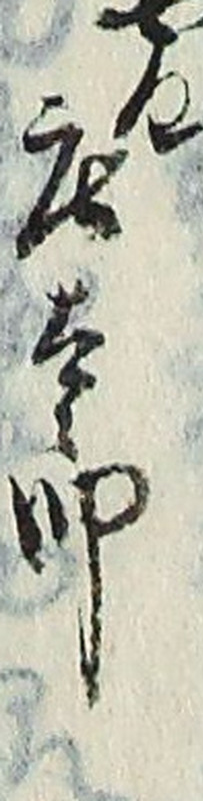庄太郎
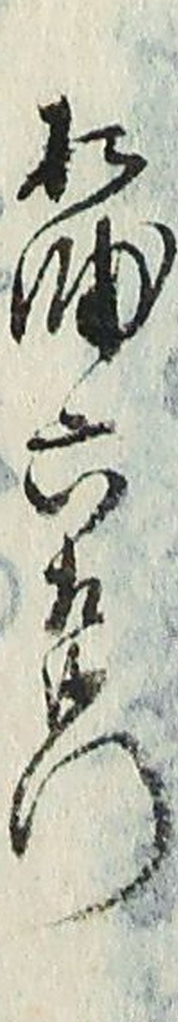杉浦六左衛門
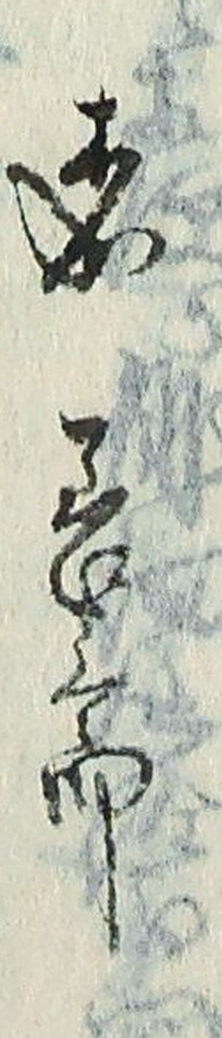森善三郎
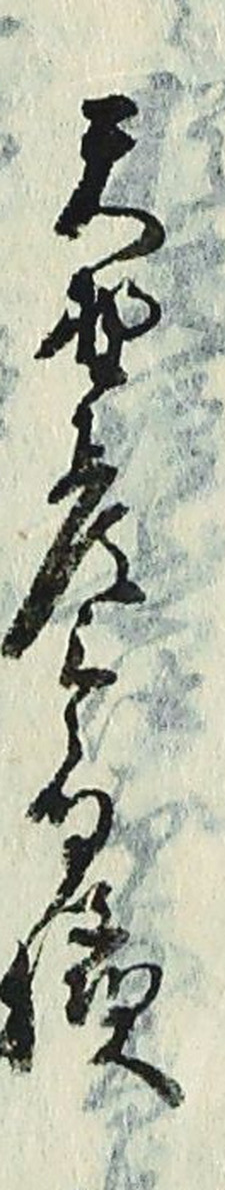天野彦三郎様
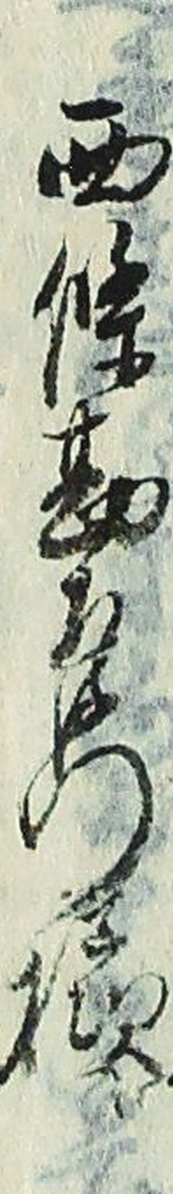西條勘左衛門様
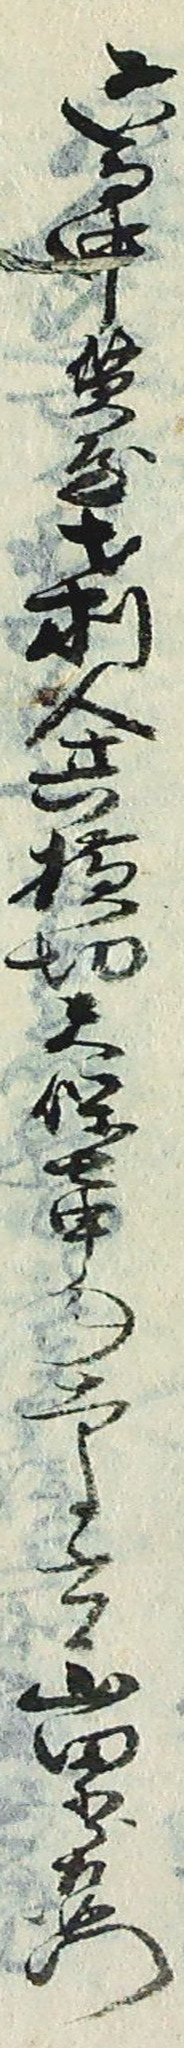右市中質屋才判人共横切天保七申年十一月六日山田五郎左衛門
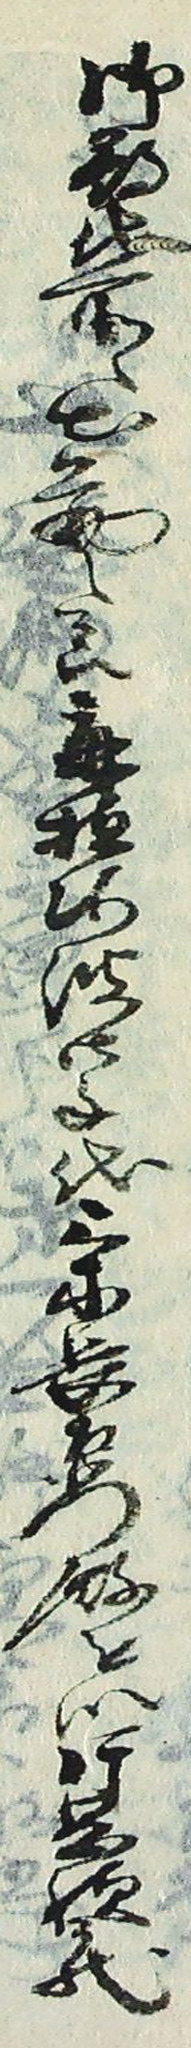御郡代所へ出勤之節麻植阿波御手代三木長左衛門殿を以片岡續蔵
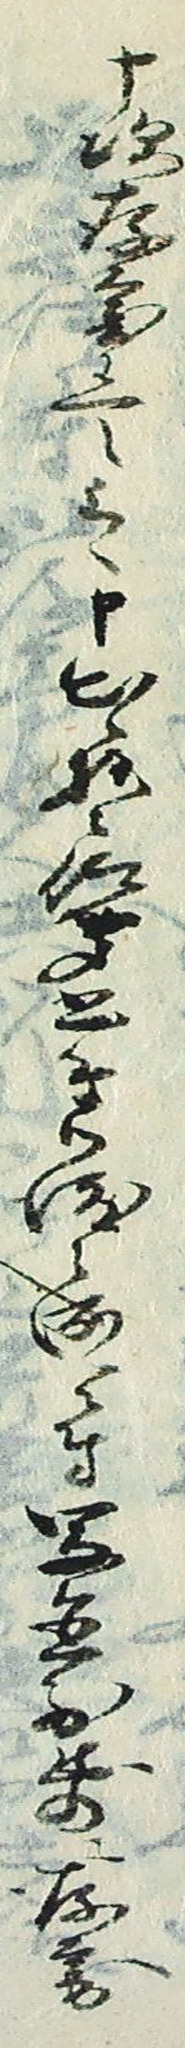申次存寄有之上へ申出候様被仰聞書付御渡被成候ニ付写置別帋ニ存寄
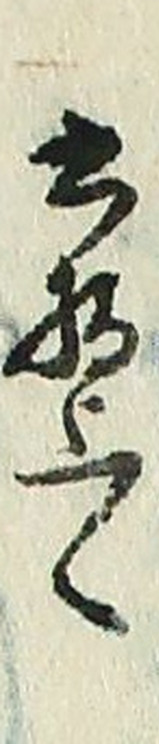書指上候
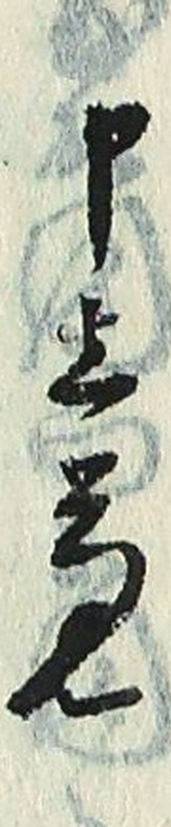申上覚
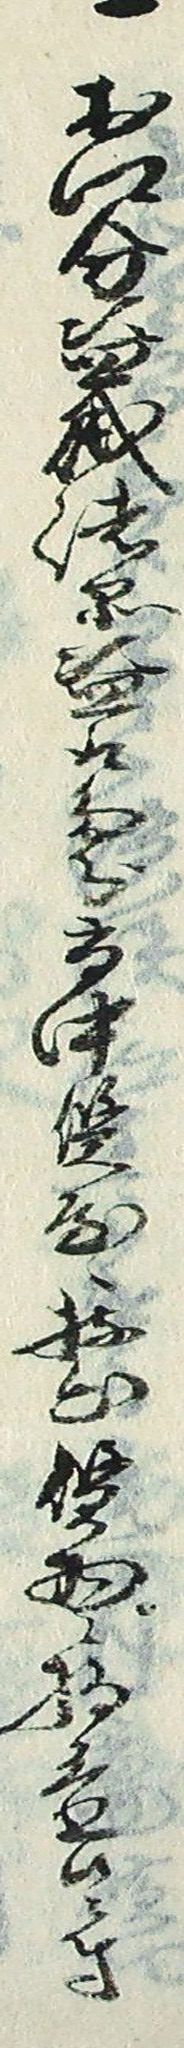一於郷分盗賊諸品盗取多分市中質屋へ指出質物ニ指置候ニ付
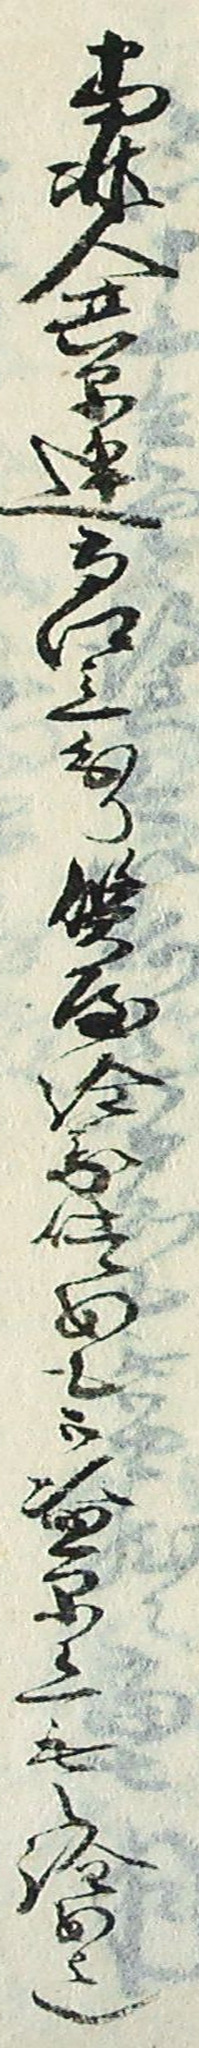番非人共早速市郷迄至り質屋詮義仕候義も被盗品有無之詮義迄
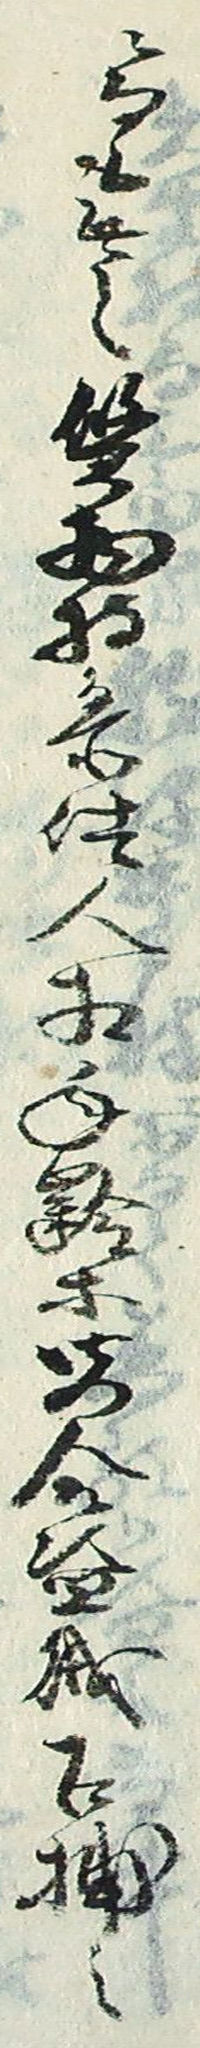ニ而も無之質物持参仕候人相年齢等聞合盗賊召捕之
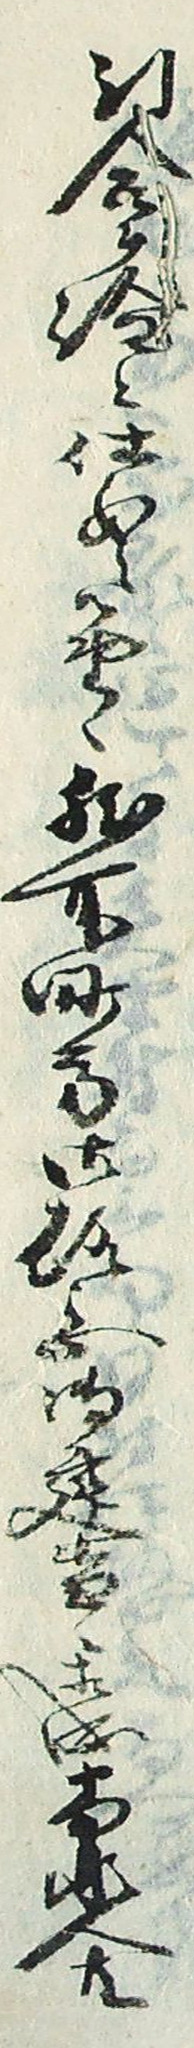引合ヲ詮ニ仕義ニ御坐候然所町方御趣意御建替ニ相成番非人共
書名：市郷質屋株御取究並御書出御趣法之写
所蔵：鳴門教育大学 Naruto University of Education
